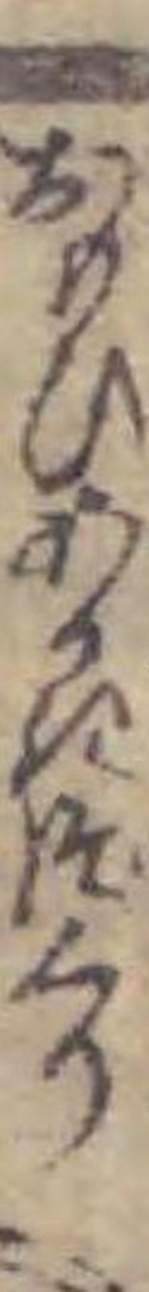おもひあかぎづくり
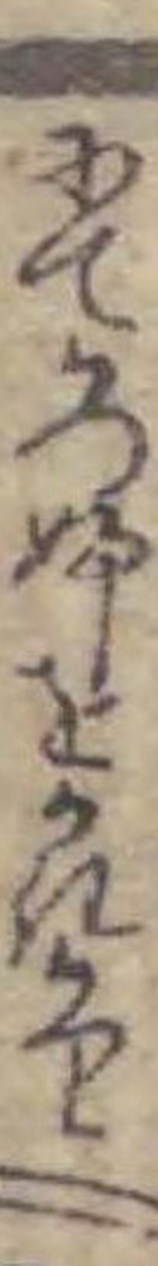にてかつふしをかきかり
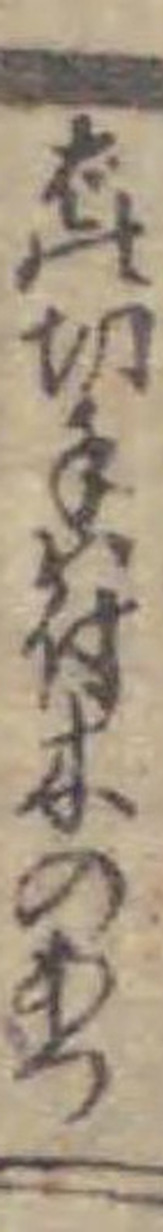ばの切手は付木のあつ
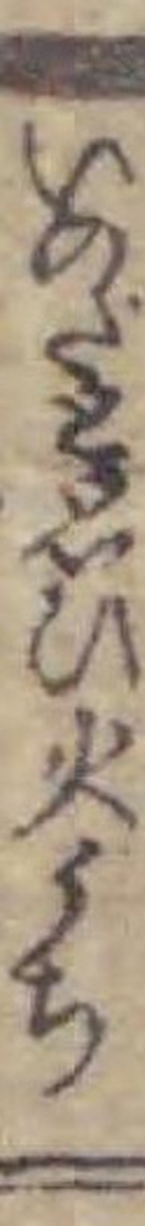いのだと思ひ火うち
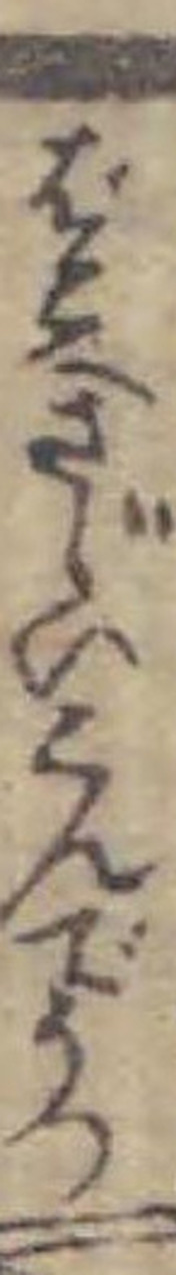ばこへさじいこんでうつ
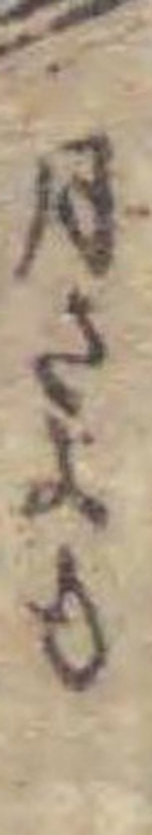月さよも
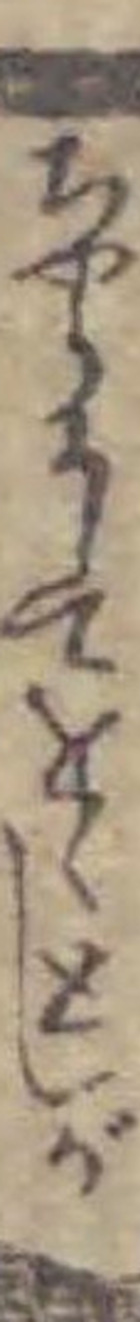ちやらかしてをくとしが
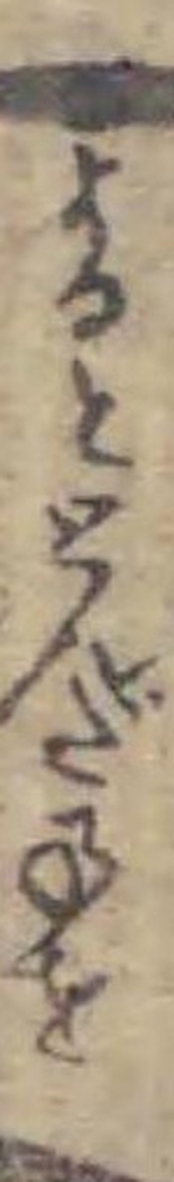よるととんだ事を
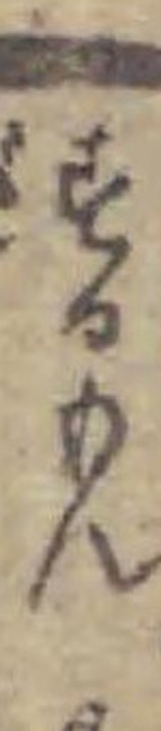するもん
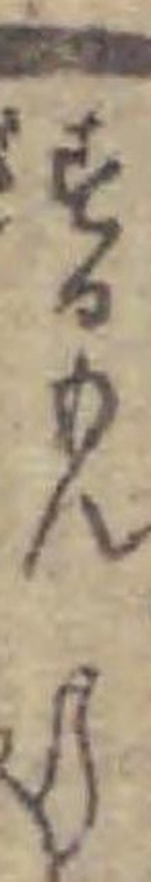するもん
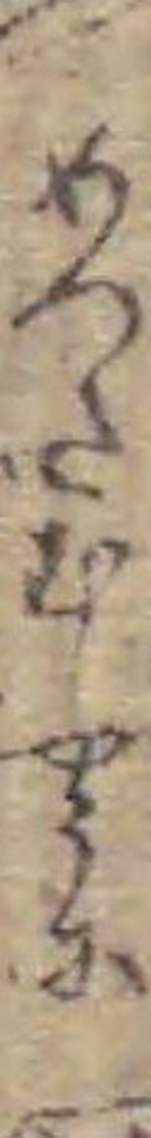めつたむしやうに
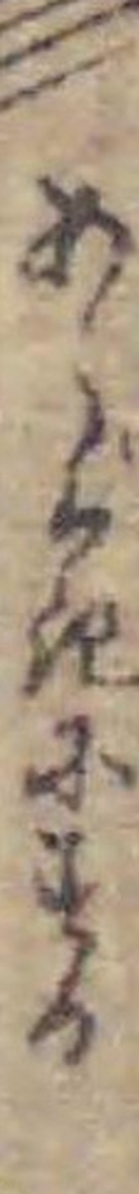あらがきにする
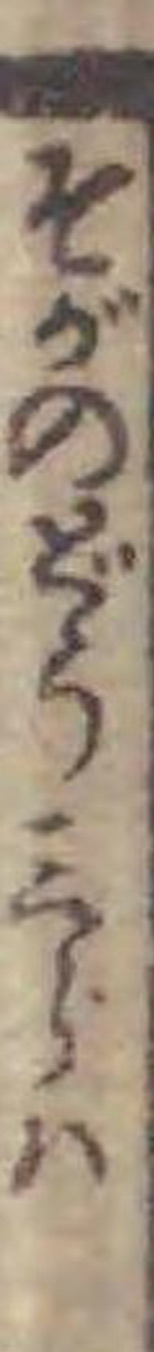そがのどう三郎は
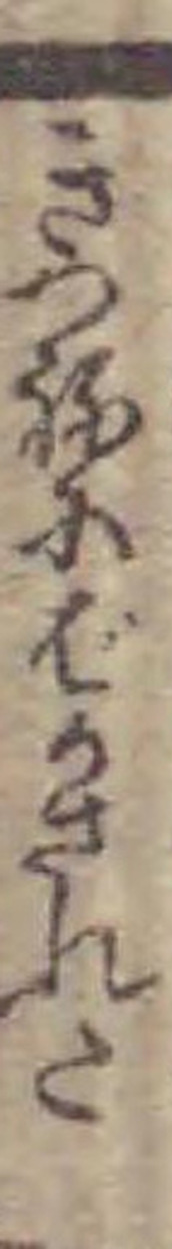きつねにばかされた
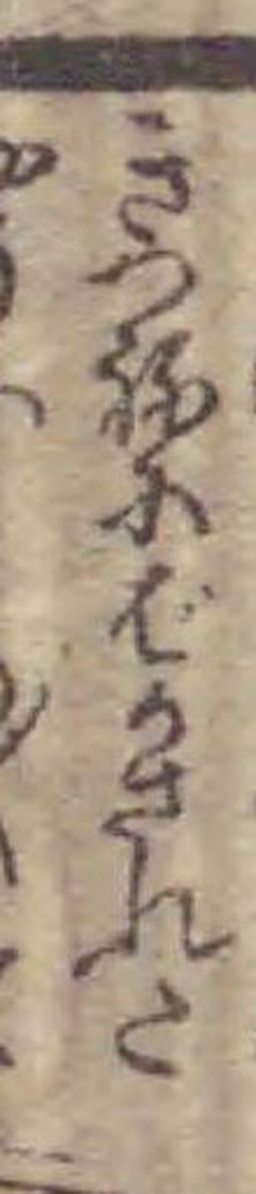きつねにばかされた
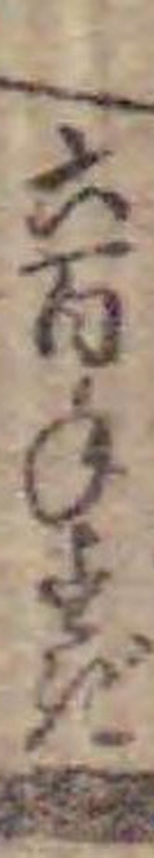六百年すぎ
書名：年寄之冷水曽我 : 3巻
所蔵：国立国会図書館 National Diet Library, JAPAN
